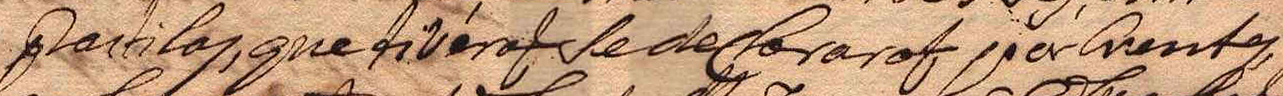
pRactiCas, que tiveraõ se declararaõ por Crentes
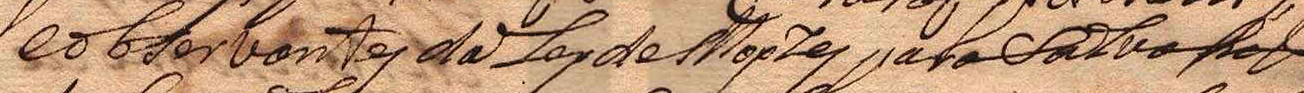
e observantes da Ley de Moyzes para Salvassaõ
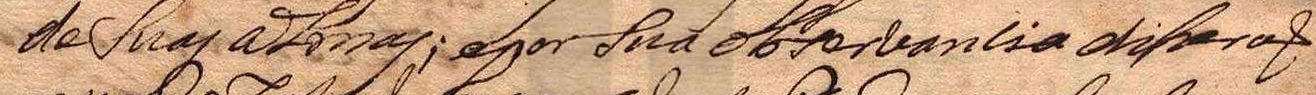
de Suas almas; e por sua observancia disseraõ
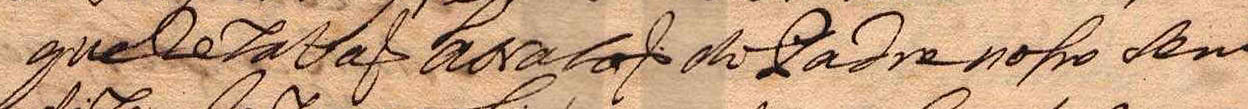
que Rezavaõ a oraçaõ do Padre nosso sem
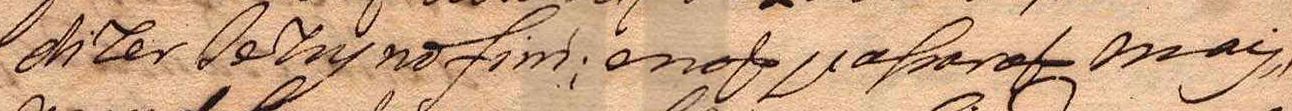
dizer Iezus no fim; e naõ passaraõ mais,
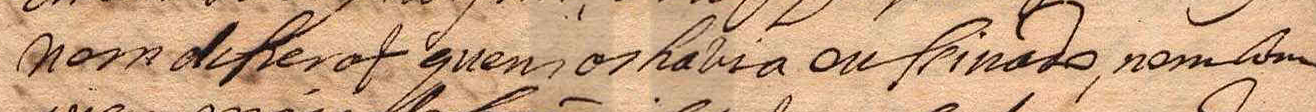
nem disseraõ quem os havia enssinado, nem Com
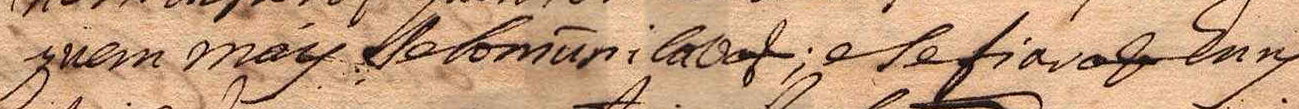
quem mais se comūnicavaõ; e se fiaraõ huns
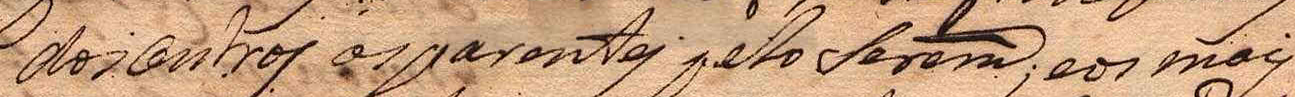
dos outros os parentes pelo serem; e os mais
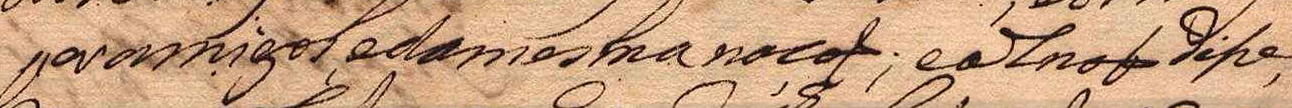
por amigos, e da mesma naçaõ; e al naõ disse
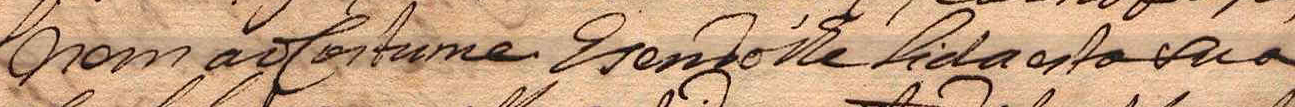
nem ao Costume E sendolhe lida esta sua
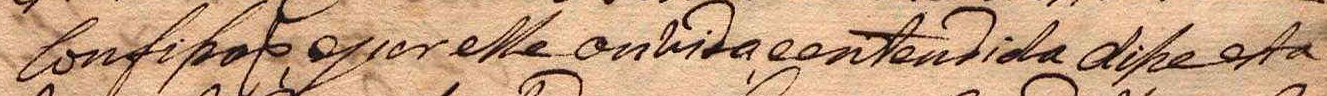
Confissaõ, e por elle ouuida e entendida disse esta
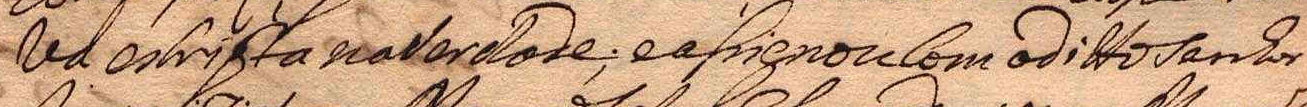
va esCripta na verdade; e assignou com o ditto senhor
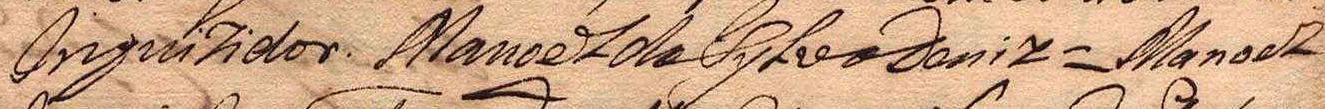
Inquizidor. Manoel da Sylva Deniz = Manoel
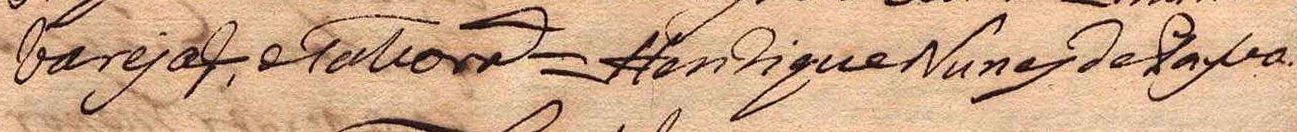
varejaõ, e Tavora = Henrique Nunes de Payva
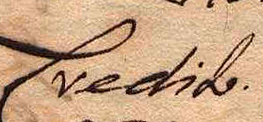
Credito.
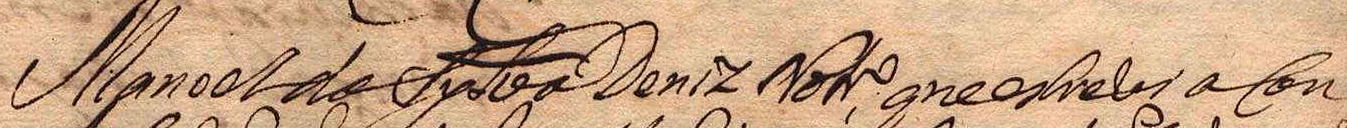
Manoel da Sylva Deniz Notr.o que esCrevi a Con
